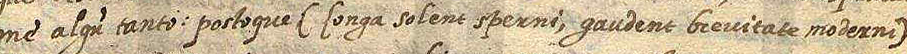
mē algū tanto: posto que (Longa solent sperni, gaudent breuitate moderni)
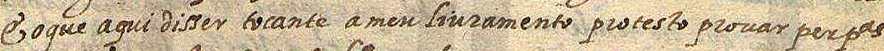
E o que aqui disser tocante a meu liuramento protesto prouar per pas
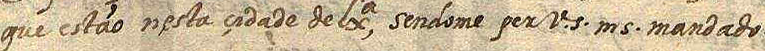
que estão nesta çidade de Lxa, sendome per V.s. ms. mandado
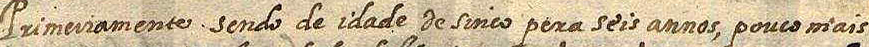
Primeiramente sendo de idade de sinco pera seis annos, pouco mais
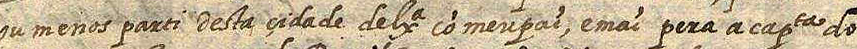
ou menos parti desta çidade de lxa cō meu paī, e maĩ pera a capta do
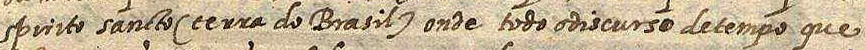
Spirito sancto (terra do Brasil) onde todo o discurso de tempo que
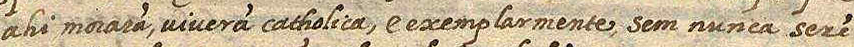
ahi morarā, uiuerā catholica, e exemplarmente, sem nunca serē
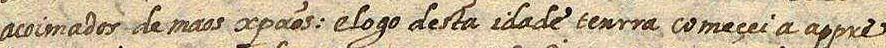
acoimados de maos xpãos: e logo desta idade tenrra começei a appre
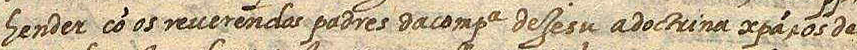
hender cō os reuerendos padres da compa de Jesu a doctrina xpa,̄ os de
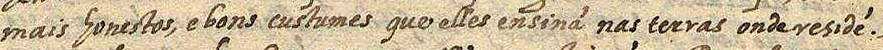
mais honestos, e bons custumes que elles ensinā nas terras onde residē
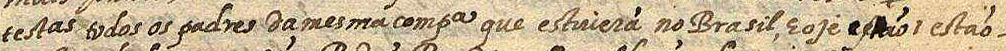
testas todos os padres da mesma compa que estiuerā no Brasil, E oje estaõ / estão
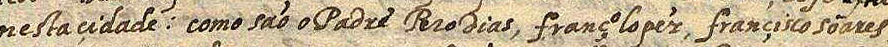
nesta çidade: como saõ o Padre Pero dias, franco lopez̄, françisco soares
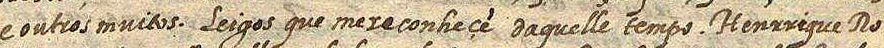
e outros muitos. Leigos que me reconheçē daquelle tempo. Henrrique Ro
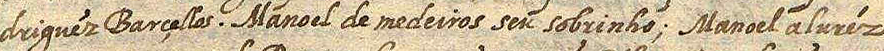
driguez̄ Barçellos. Manoel de medeiros seu sobrinho; Manoel alurez̄
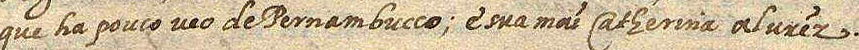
que ha pouco ueo de Pernambucco; e sua mae Catherina alurez̄.
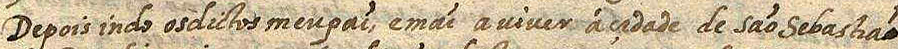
Depois indo os dictos meu paī, e maĩ a uiuer á çidade de saõ sebastiaõ
